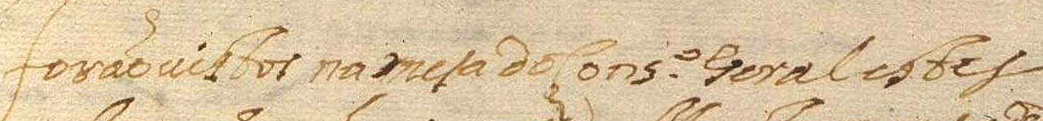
Foraõ uistos na mesa do Cons.o Geral estes
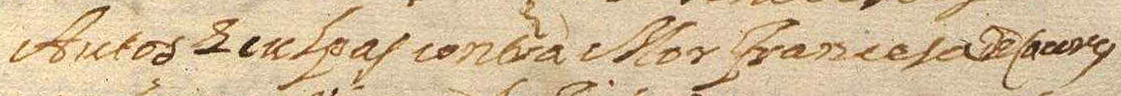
Autos E culpas contra Mor Francesa de Caceres
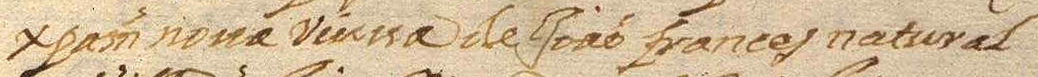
xpam noua viuua de Joaõ frances natural
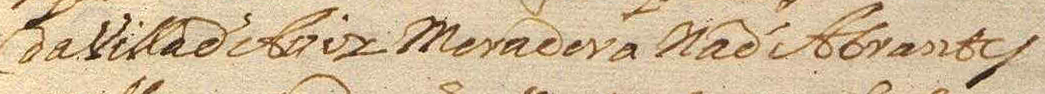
da Villa Auiz moradora na d'Abrantes
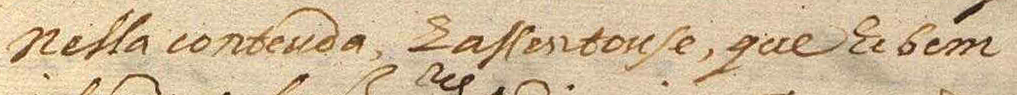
nella conteuda, E assentouse, que he bem
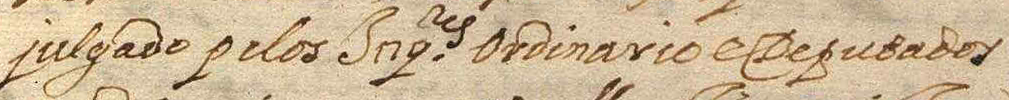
julgado pelos Inq.res Ordinario e Deputados
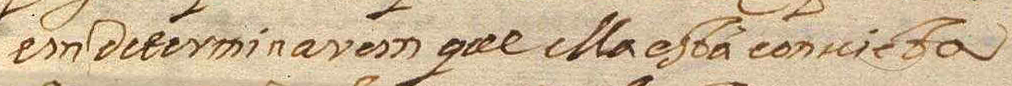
em determinarem que ella está conuicta
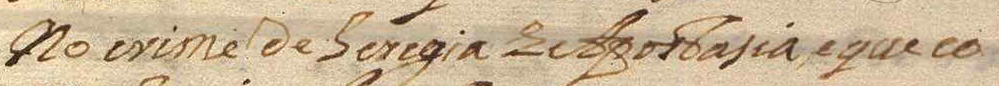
no crime de heregia E Apostasia, e que co
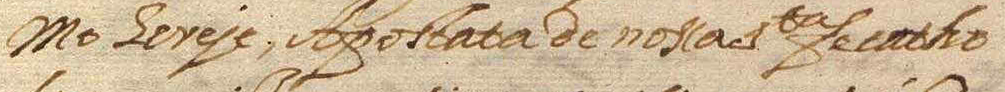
mo hereje, Apostata de nossa sta fe catho
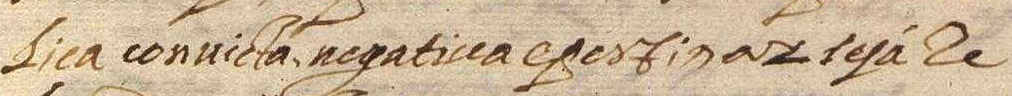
Lica, conuicta negatiua e pertinaz seja Re
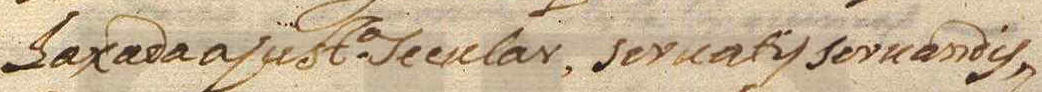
laxada a Just.a secular seruatis seruandis
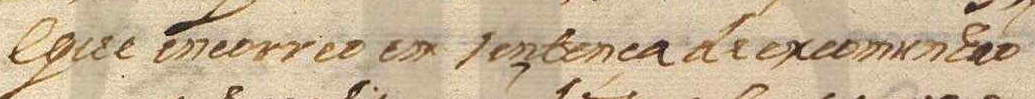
e que incorreo em sentença de excomunhaõ
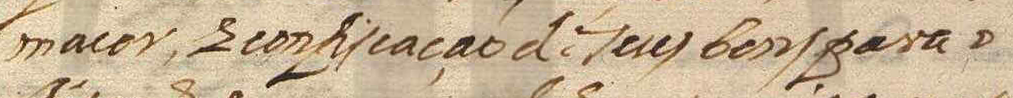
maior, E confiscaçaõ de seus bens para o
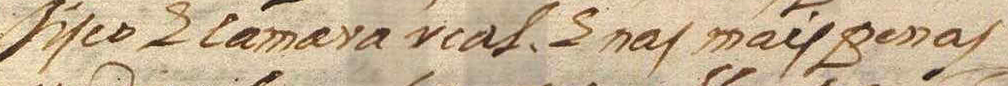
fisco E camara real e nas mais penas
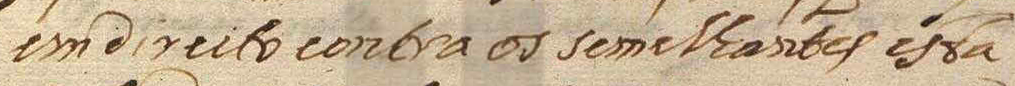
em direito contra os semelhantes esta
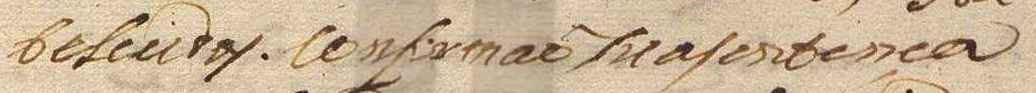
belecidas confirmaõ sua sentença
